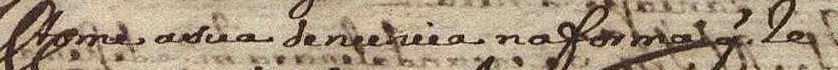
tome a sua denuncia na forma q̄ Re
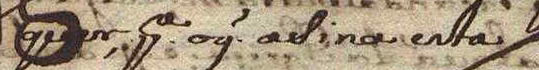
quer, p.a o q̄ asina esta
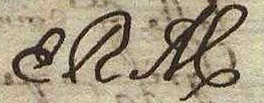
E R M
